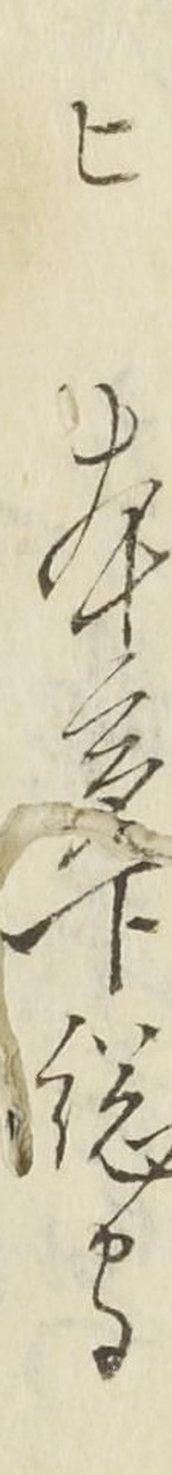ヒ本多下総守
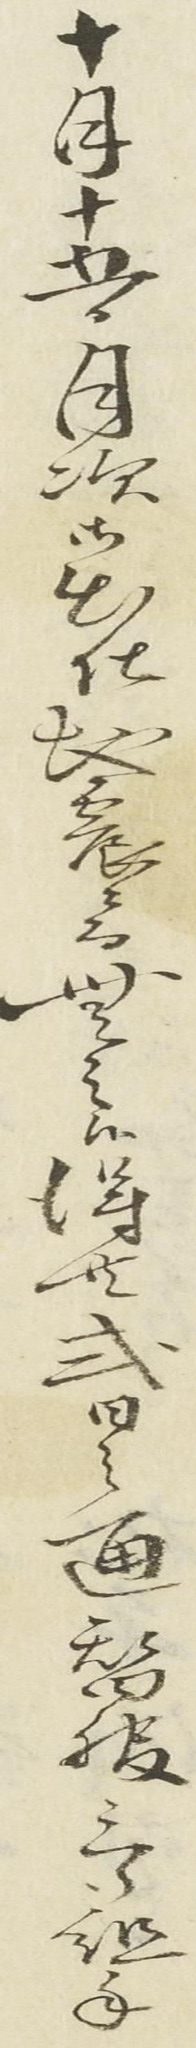十月十五日月次御出仕地ニ而無之候得共式日之通替服三ツ組手
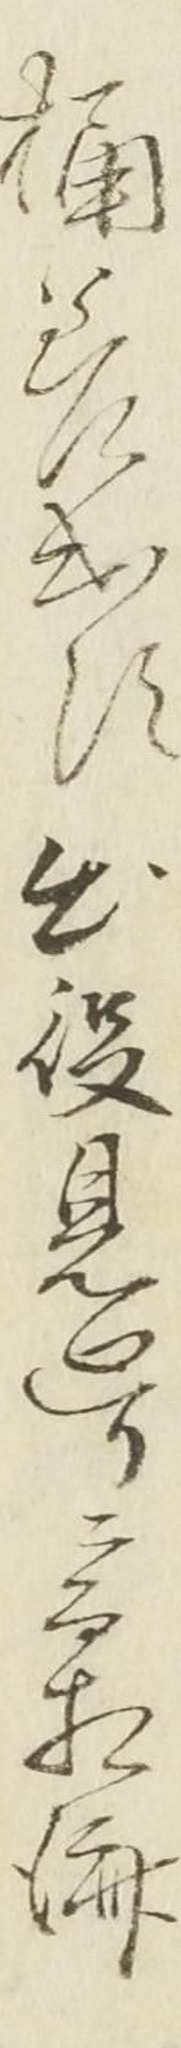桶差出す出役見廻りニ而相済
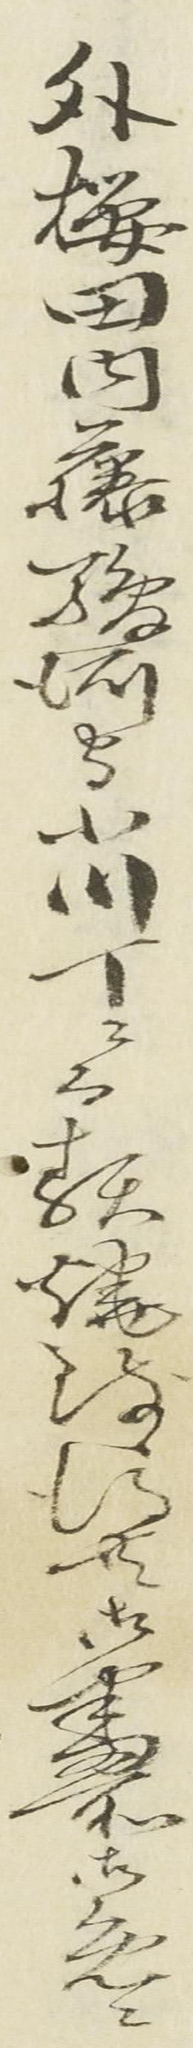外桜田内藤駿河守小川丁ニ而類焼致候得共御番所御免ニ
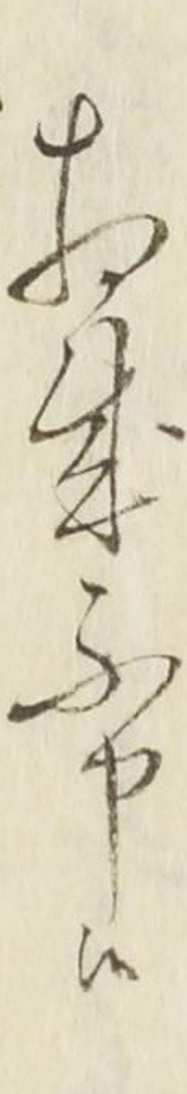相成不申候
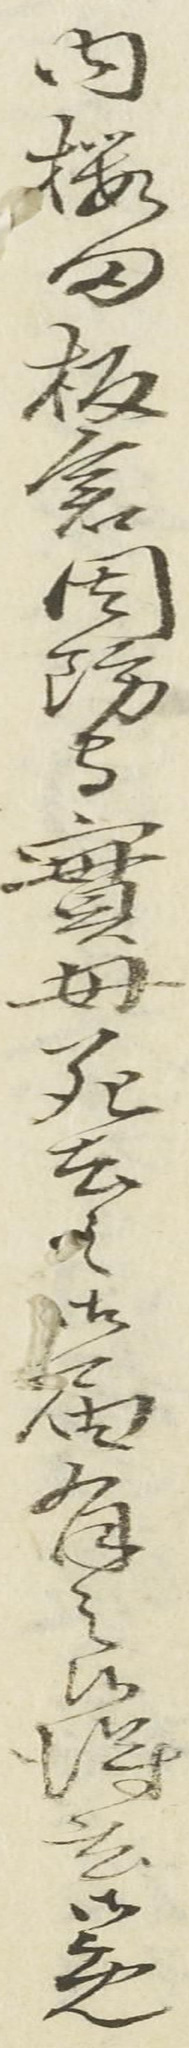内桜田板倉周防守実母死去之御届有之候得共御免
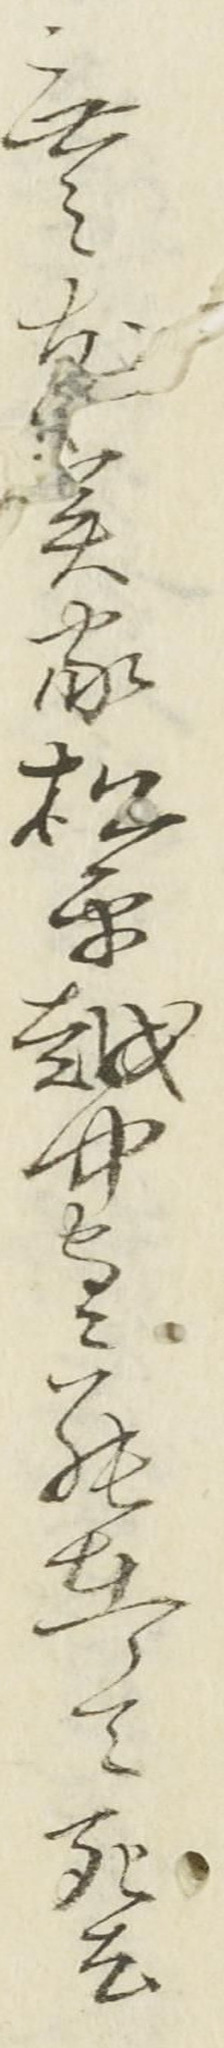無之尤実家松平越中守ニ罷在て死去
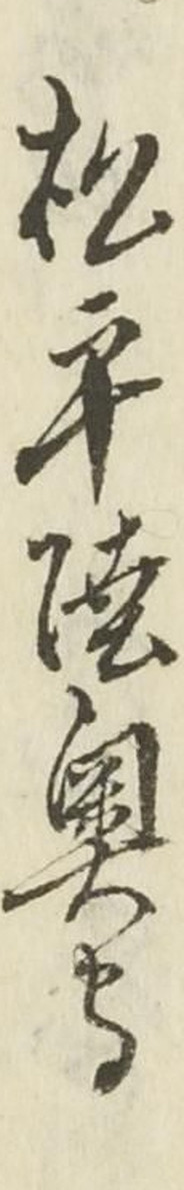松平陸奥守
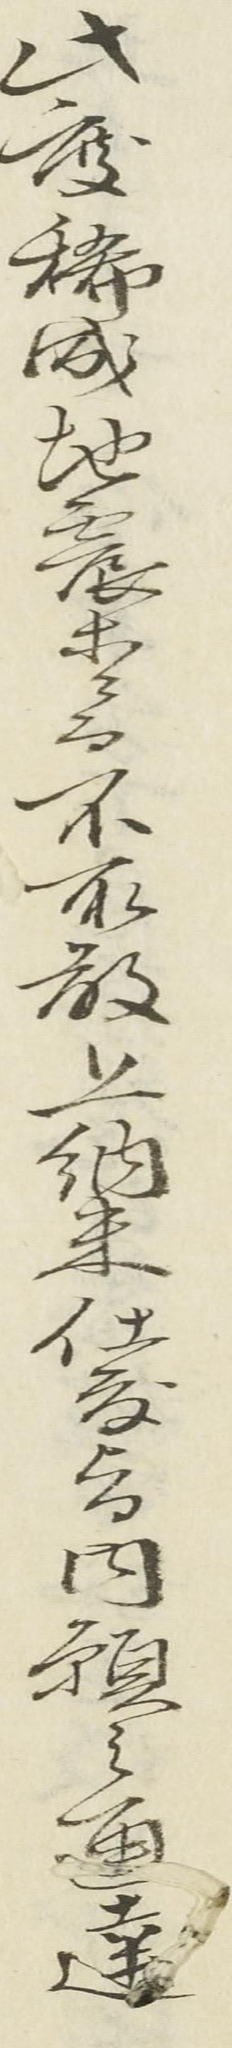此度稀成地震等ニ而不取敢上納米仕度旨内願之通達
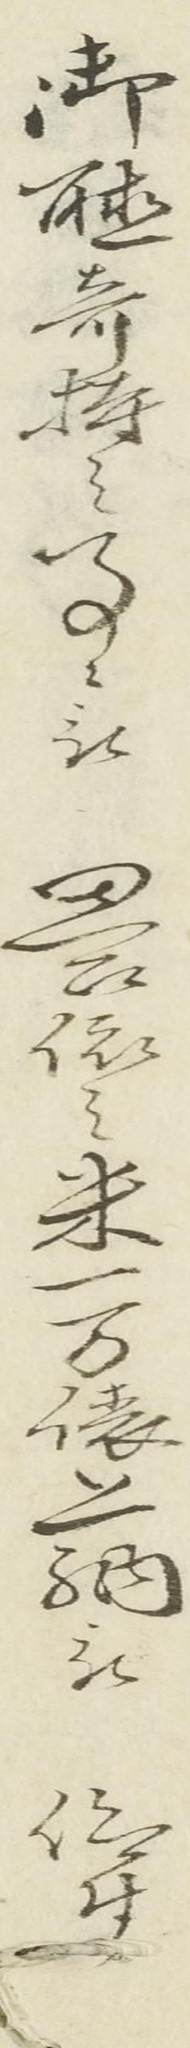御聴奇特之事ニ被思召依之米一万俵上納被仰付
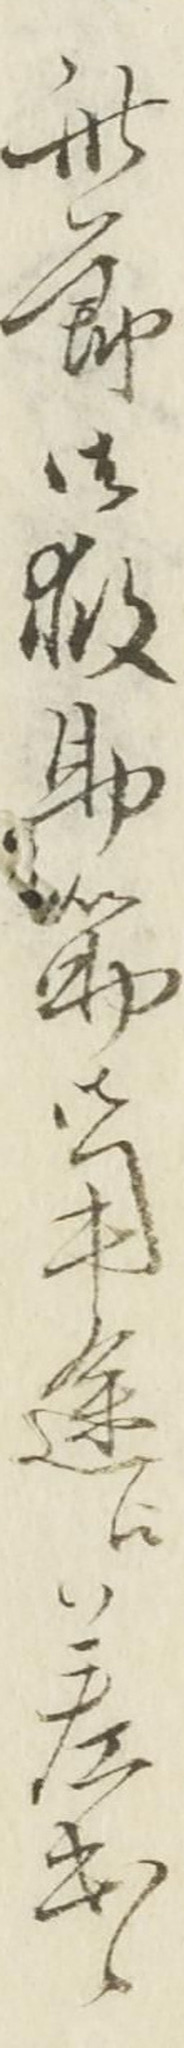此節御救助筋御用途え差出候
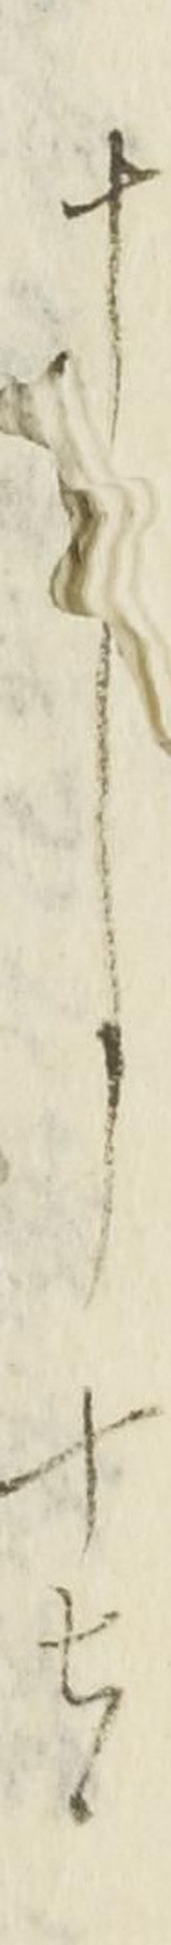十月十七日
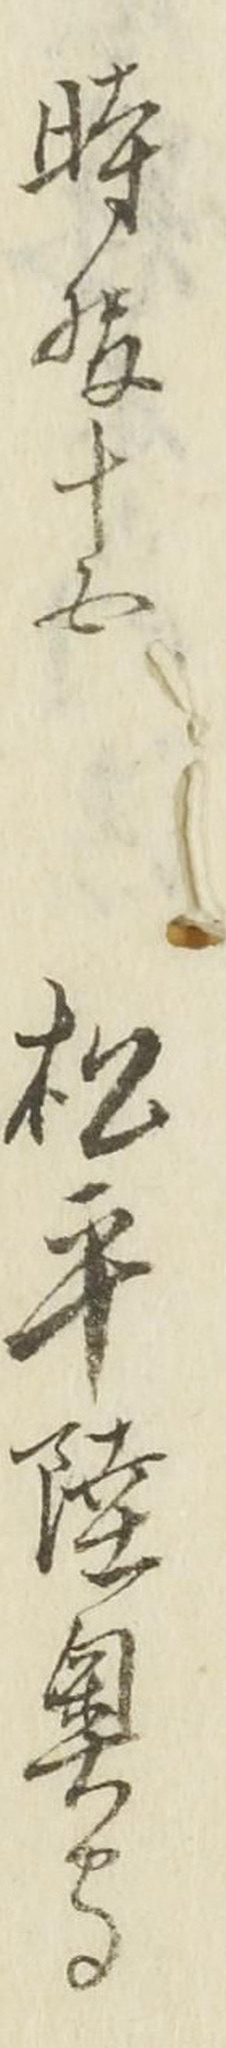時服十五松平陸奥守
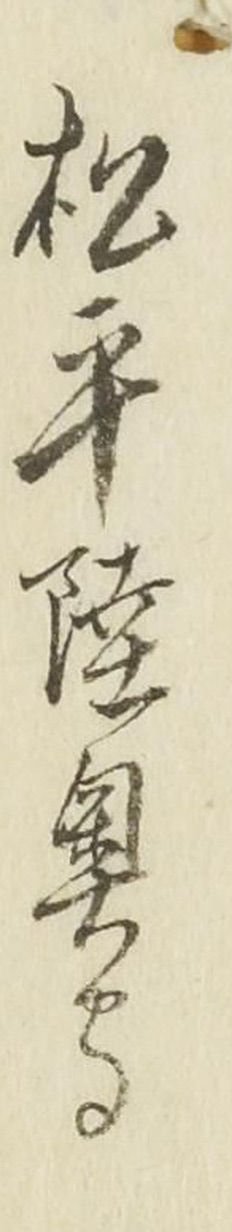松平陸奥守
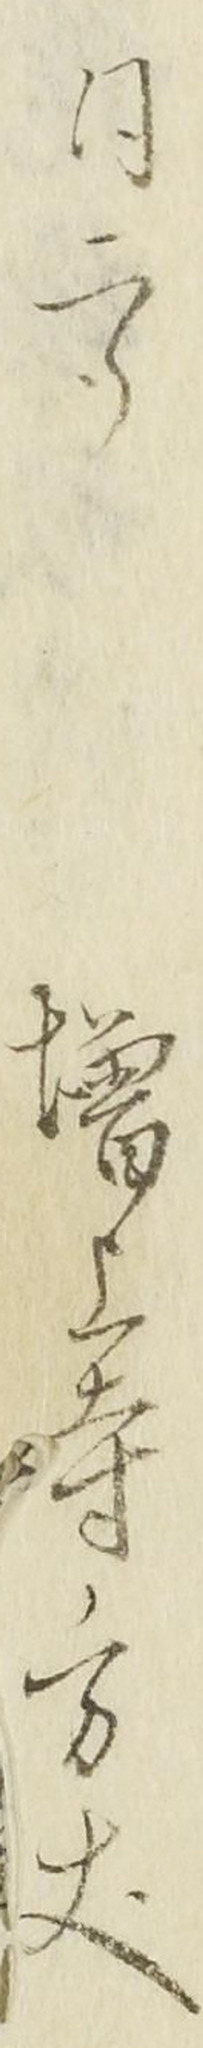同二ッ増上寺方丈
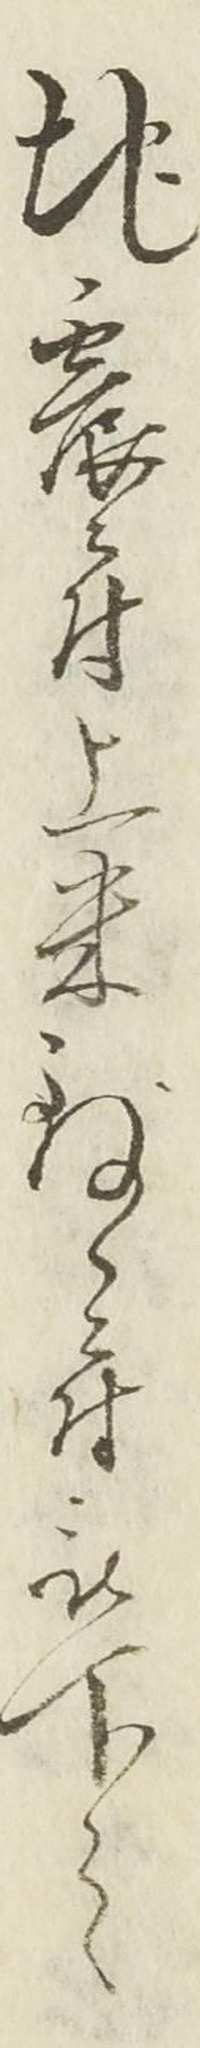地震ニ付上米致候ニ付被下之
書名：安政二乙卯年十月二日大地震之事
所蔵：東京大学地震研究所図書室 Earthquake Research Institute Library, The University of Tokyo, JAPAN
